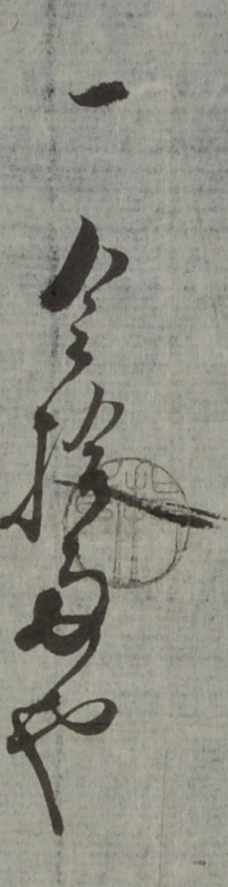一金拾両也
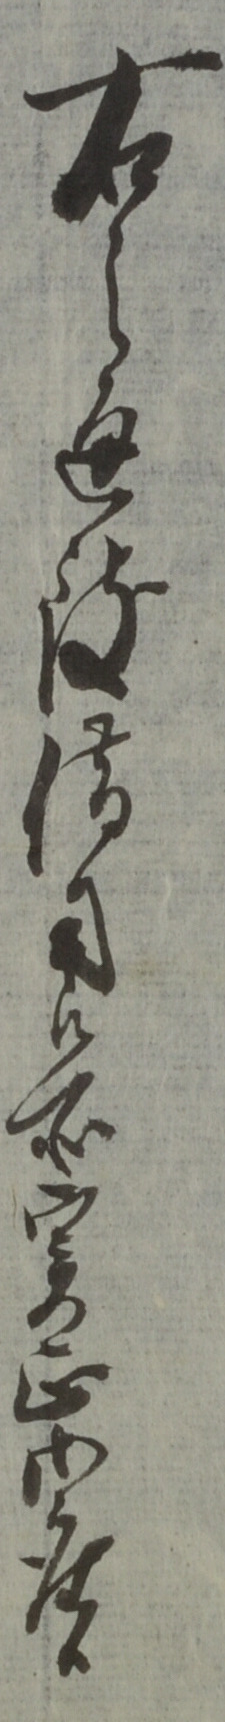右之通致借用候所実正御座候
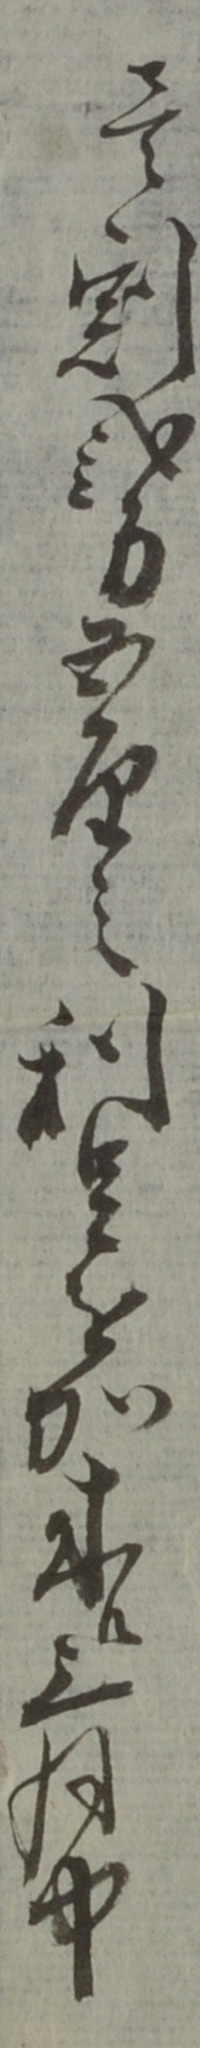壱割弐分五厘之利足を加来ル三月中
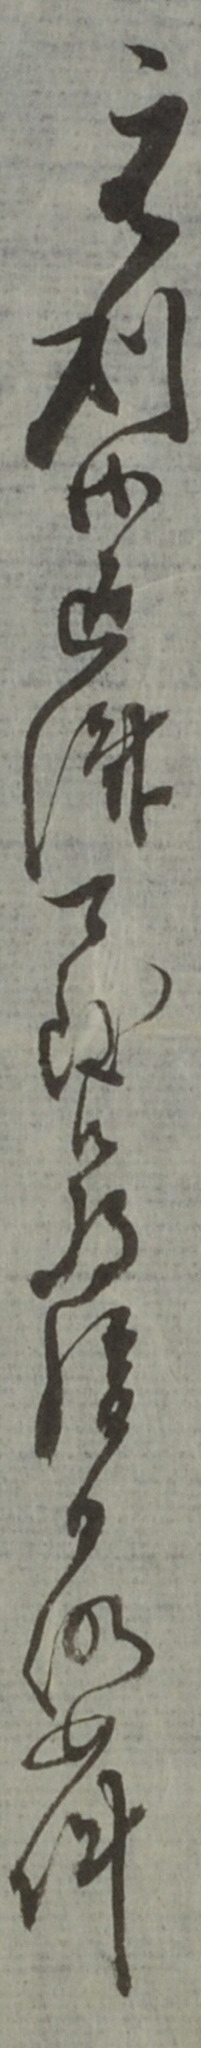元利御返済可致候為後日仍如件
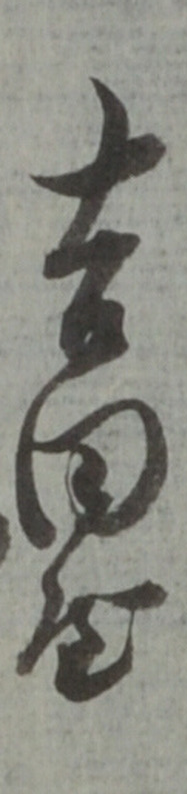吉田屋
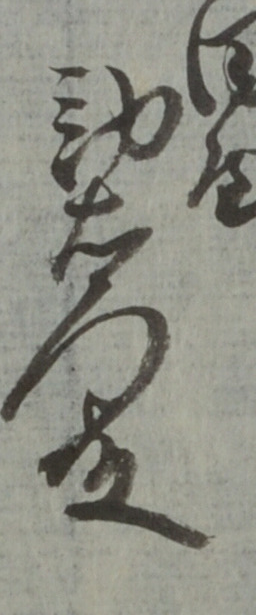勘右衛門殿

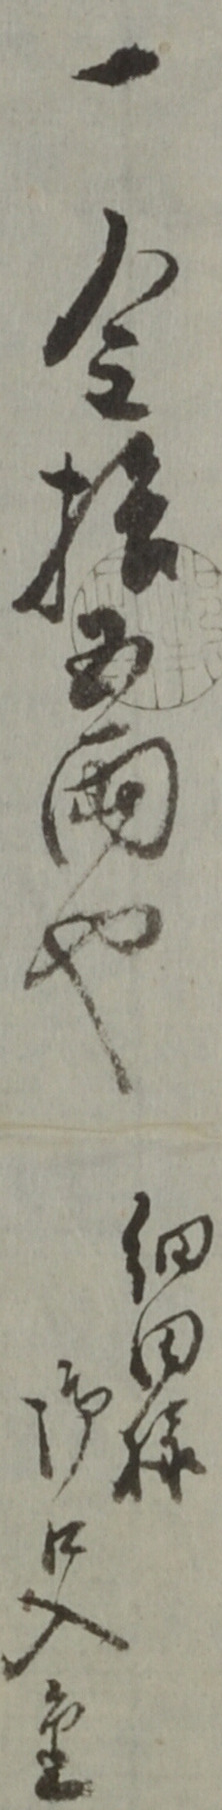一金拾五両也細田様
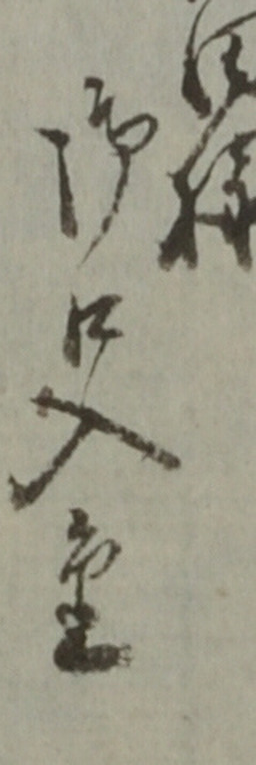御口入金
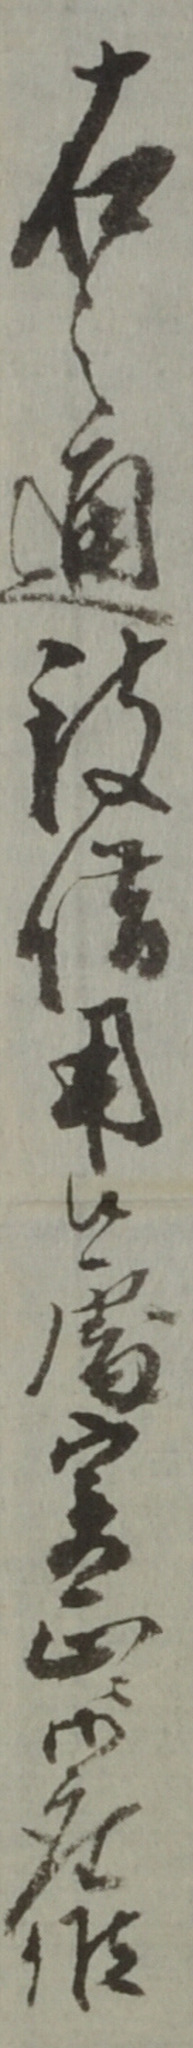右之通致借用候処実正ニ御座候
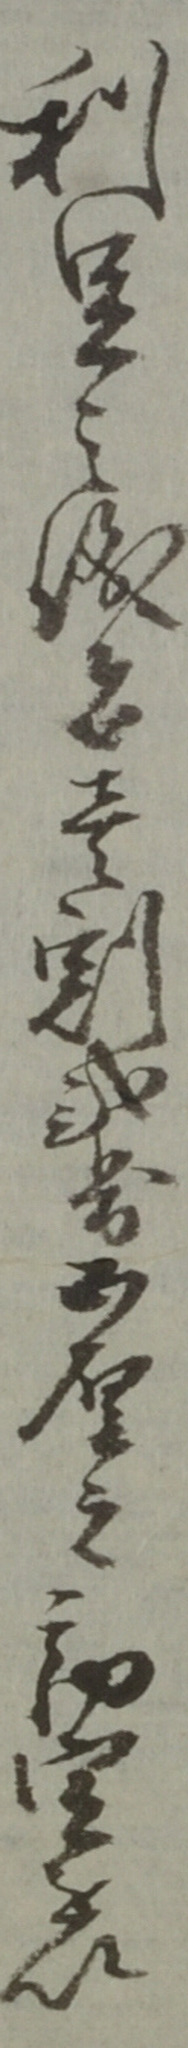利足之儀は壱割弐歩五厘之勘定を以
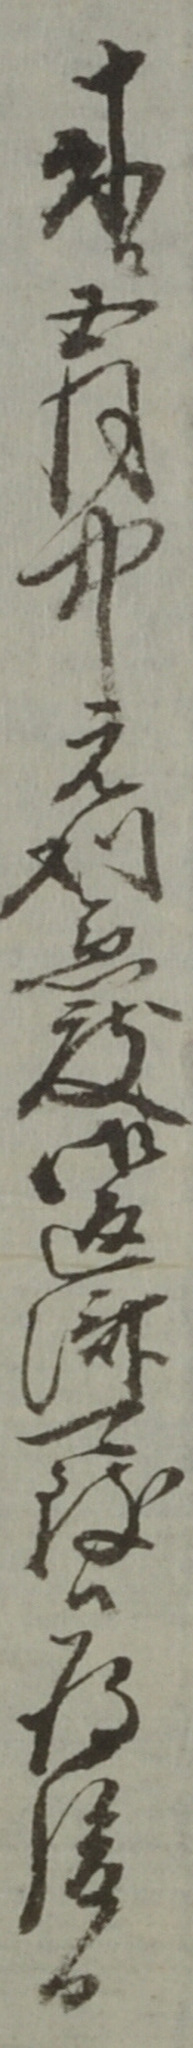来ル五月中元利急度御返済可致候為後日
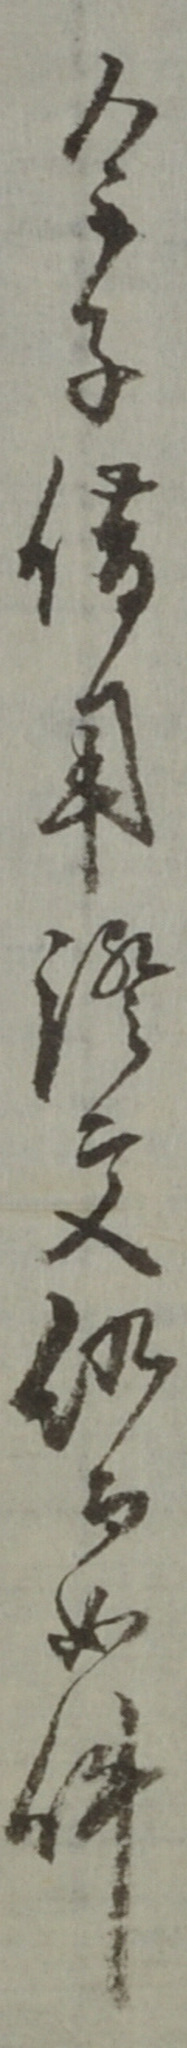金子借用証文仍而如件
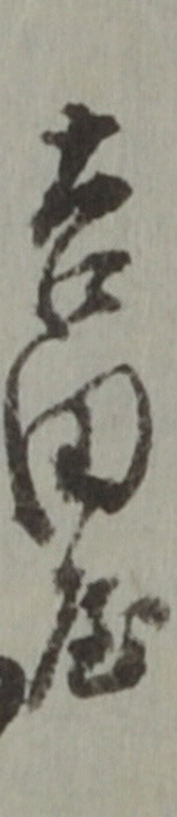吉田屋
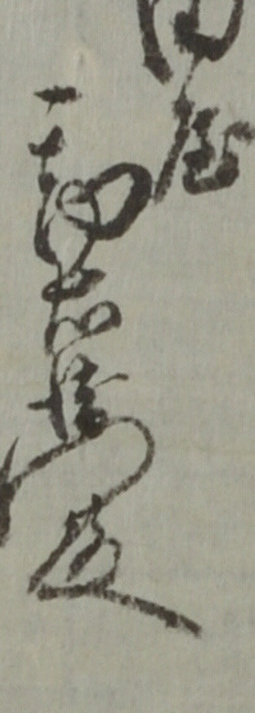勘右衛門殿
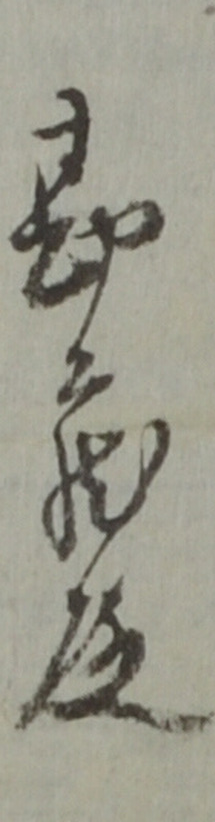勘蔵殿

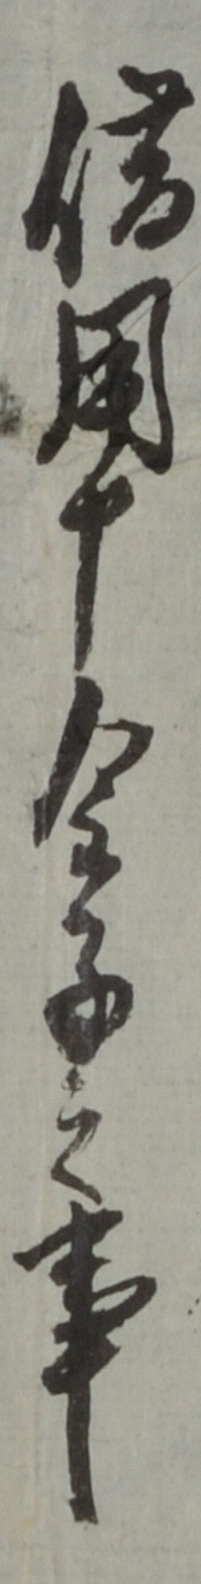借用申金子之事
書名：拝借證文之事
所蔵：伊那市立高遠町図書館・合同会社AMANE
